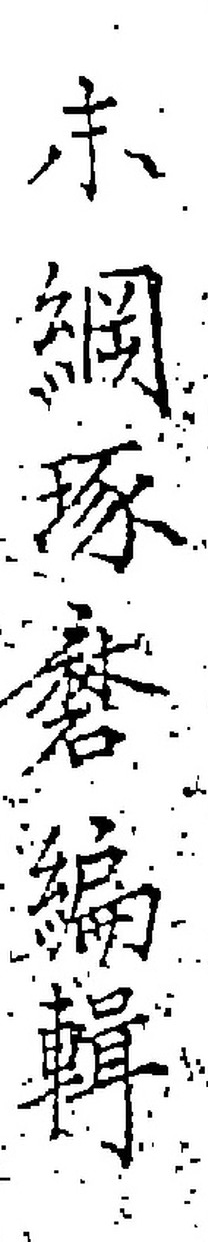末綱琢磨編輯
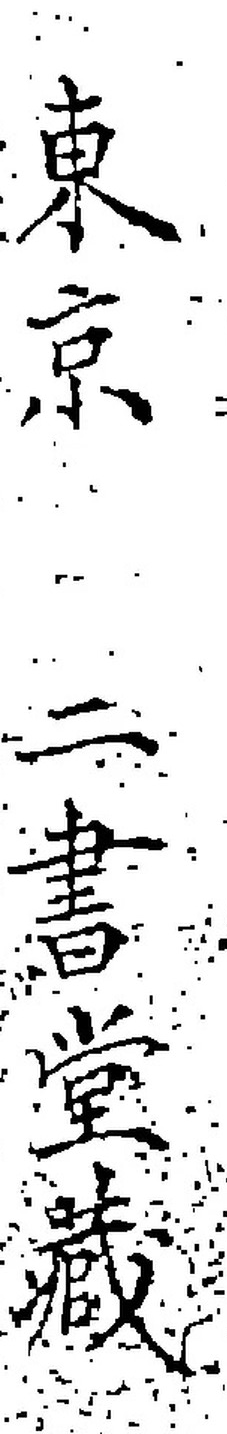東京二書堂藏
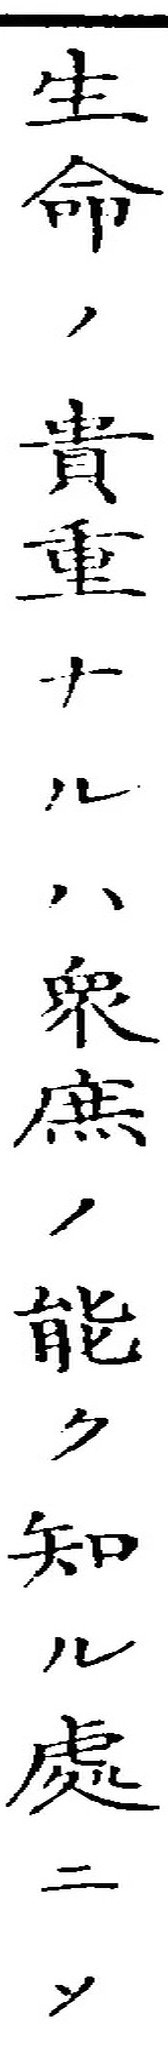生命ノ貴重ナルハ衆庶ノ能ク知ル處ニ𬼀
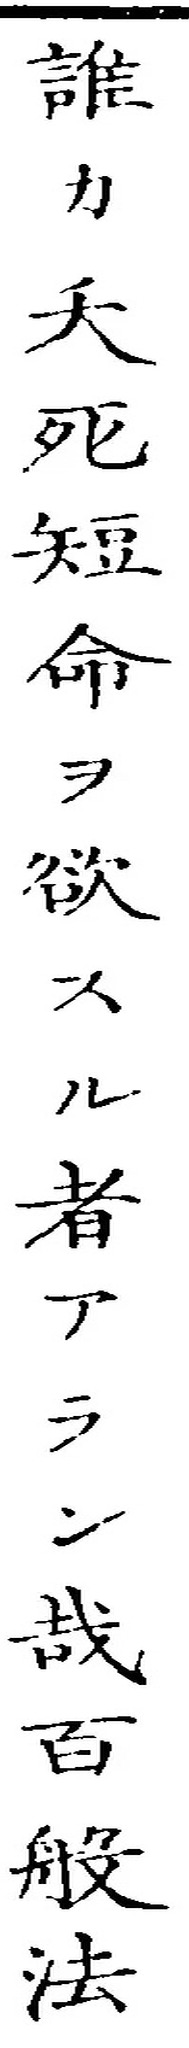誰カ夭死短命ヲ欲スル者アラン哉百般法
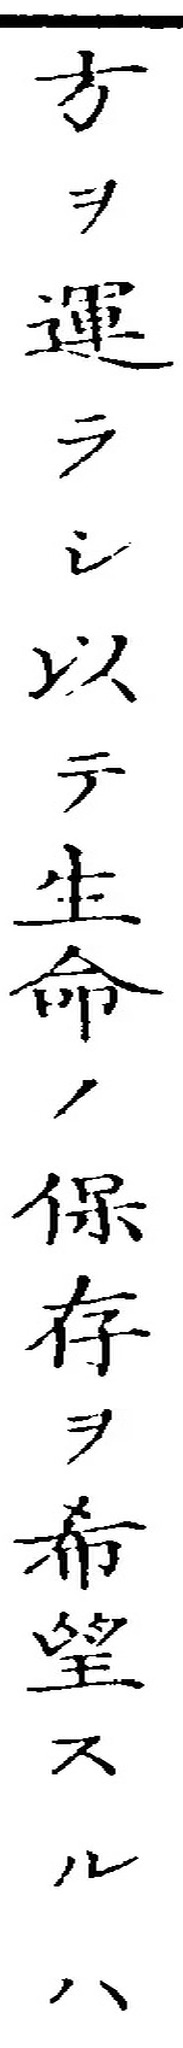方ヲ運ラシ以テ生命ノ保存ヲ希望スルハ
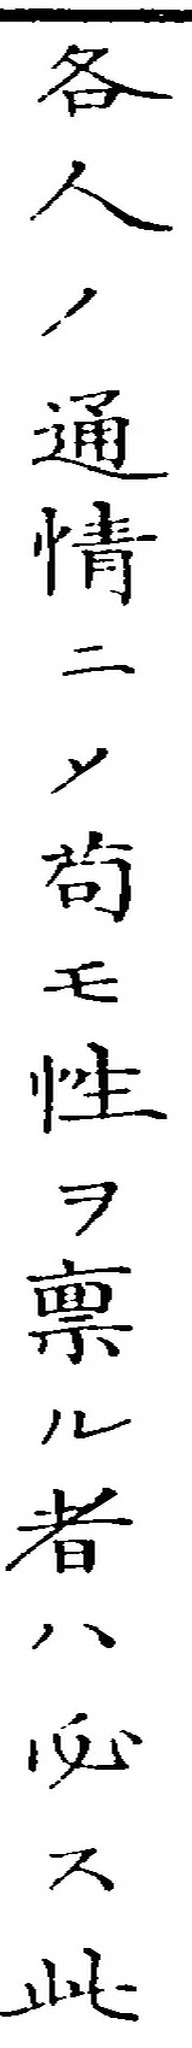各人ノ通情ニ𬼀苟モ性ヲ禀ル者ハ必ス此
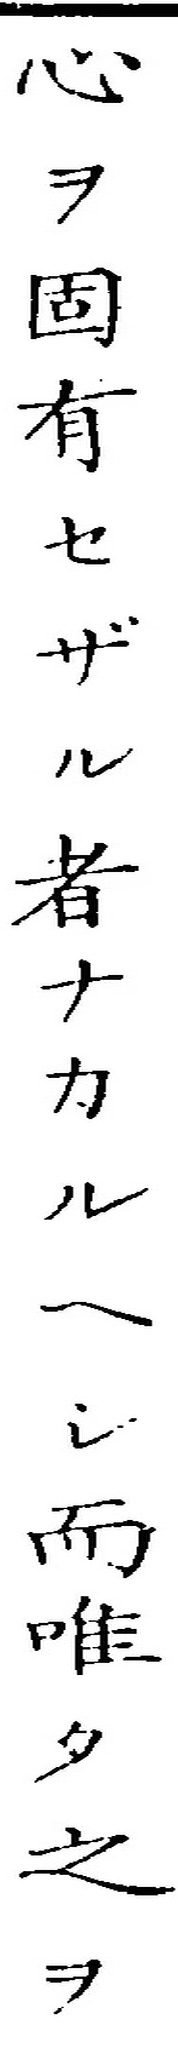心ヲ固有セザル者ナカルヘシ而唯タ之ヲ
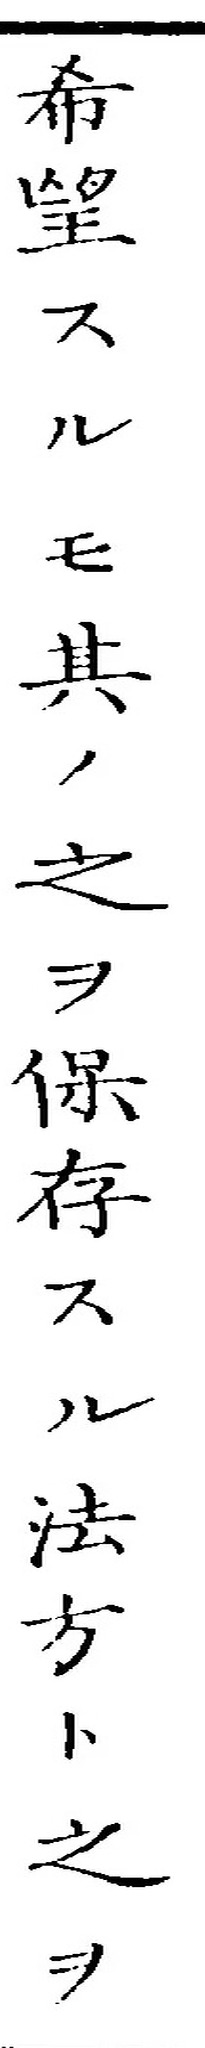希望スルモ其ノ之ヲ保存スル法方ト之ヲ
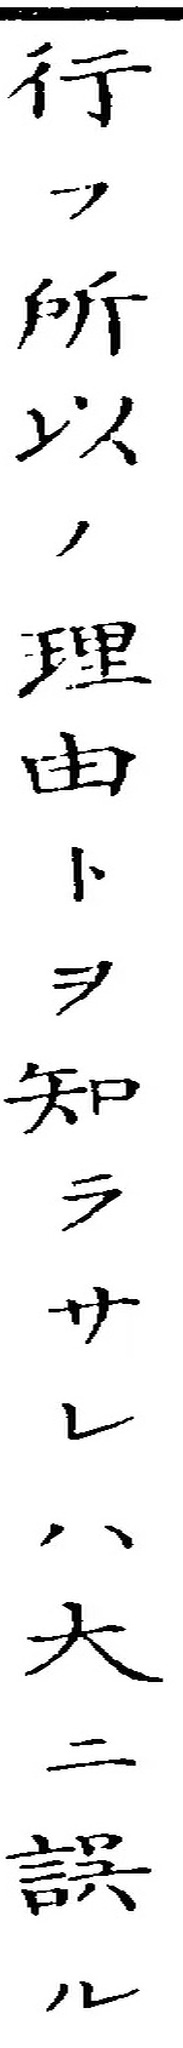行フ所以ノ理由トヲ知ラサレハ大ニ誤ル

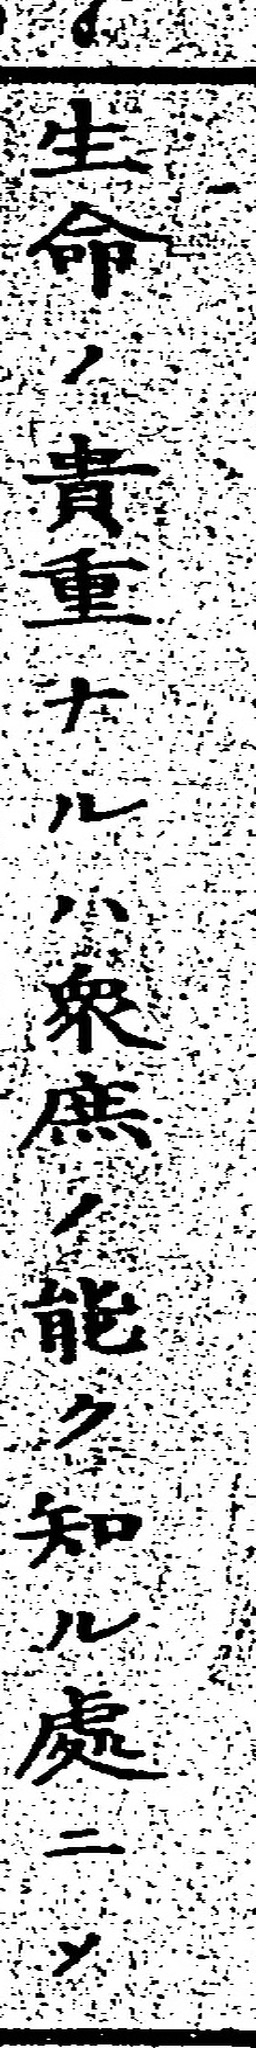生命ノ貴重ナルハ衆庶ノ能ク知ル處ニ𬼀
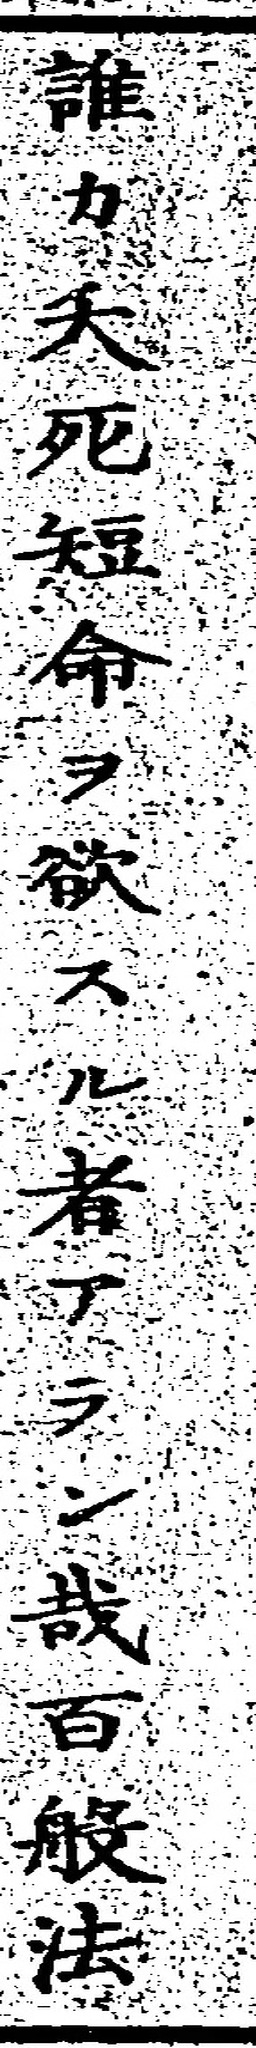誰カ夭死短命ヲ欲スル者アラン哉百般法
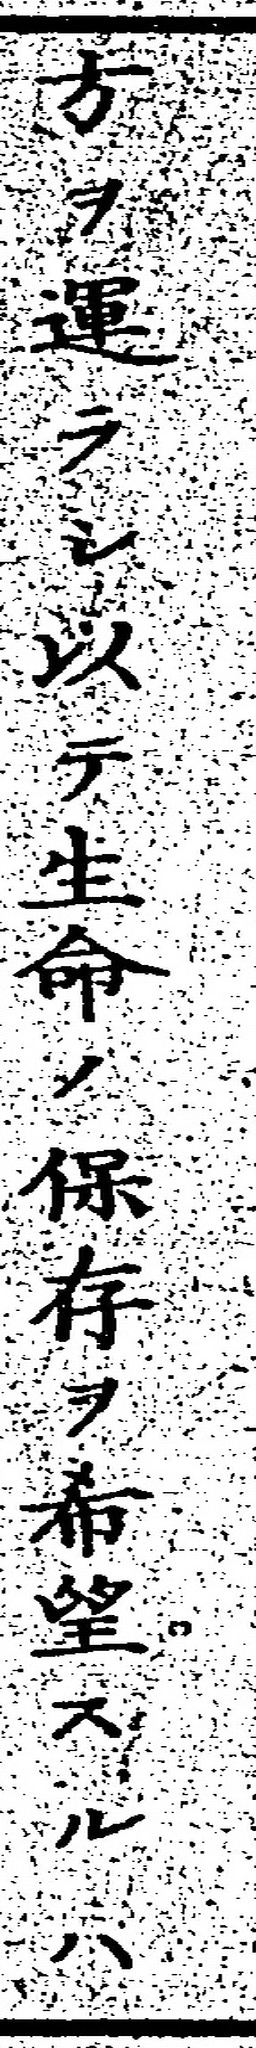方ヲ運ラシ以テ生命ノ保存ヲ希望スルハ
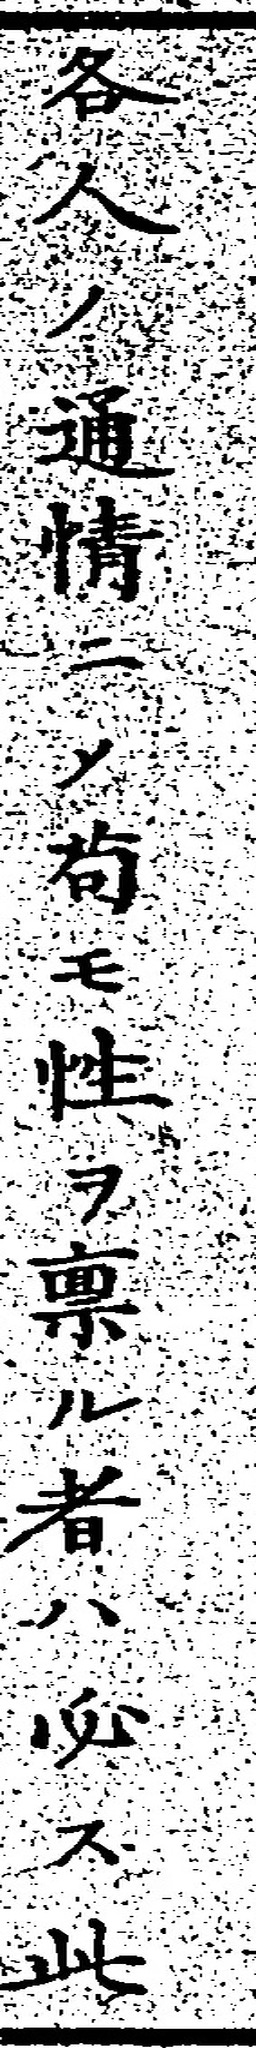各人ノ通情ニ𬼀苟モ性ヲ禀ル者ハ必ス此
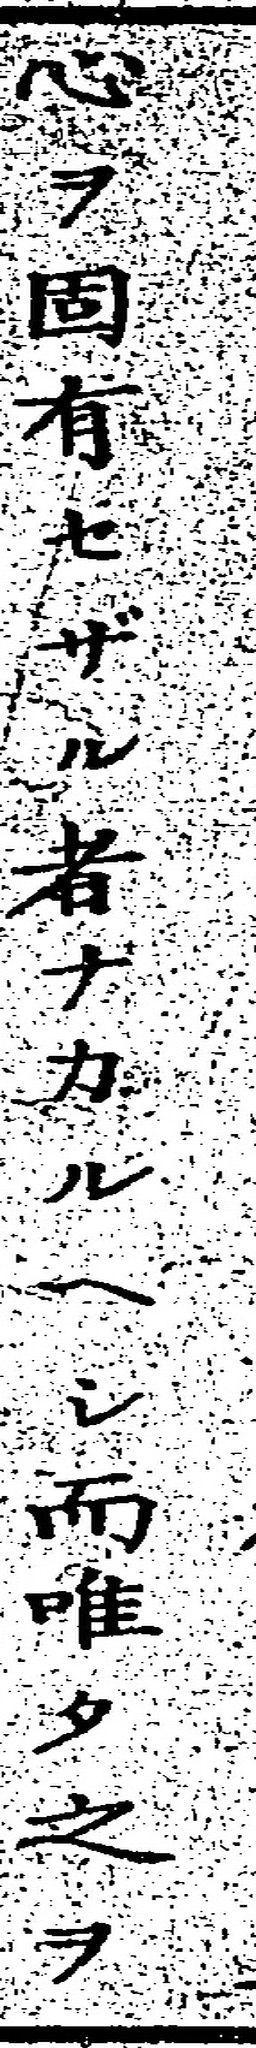心ヲ固有セザル者ナカルヘシ而唯タ之ヲ
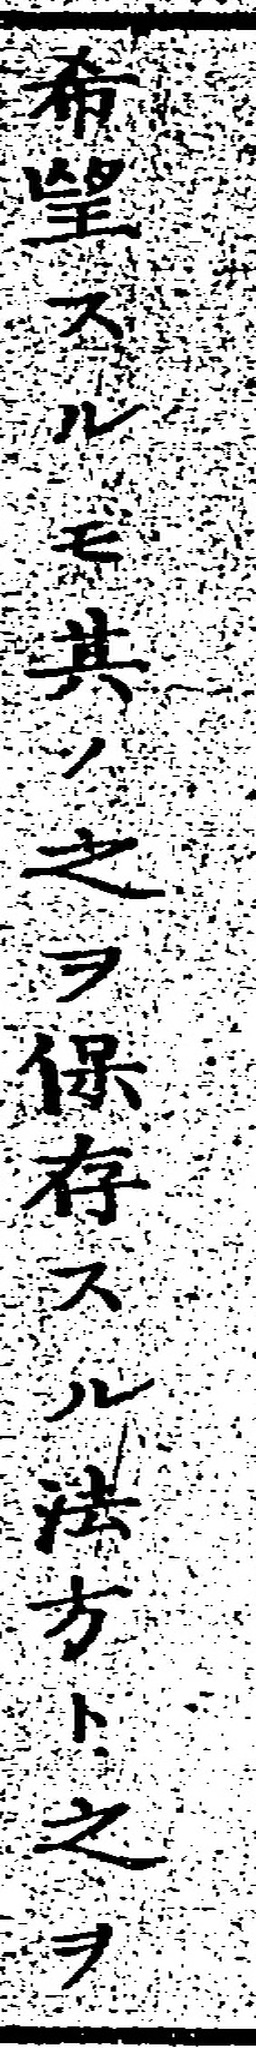希望スルモ其ノ之ヲ保存スル法方ト之ヲ
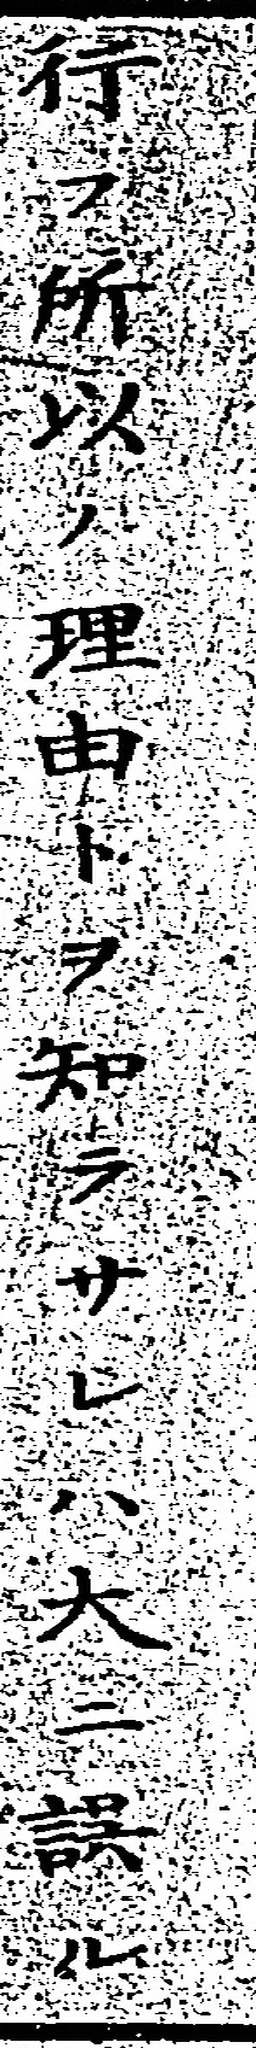行フ所以ノ理由トヲ知ラサレハ大ニ誤ル
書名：コレラ予防命乃後見
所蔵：国立国会図書館 National Diet Library, JAPAN
